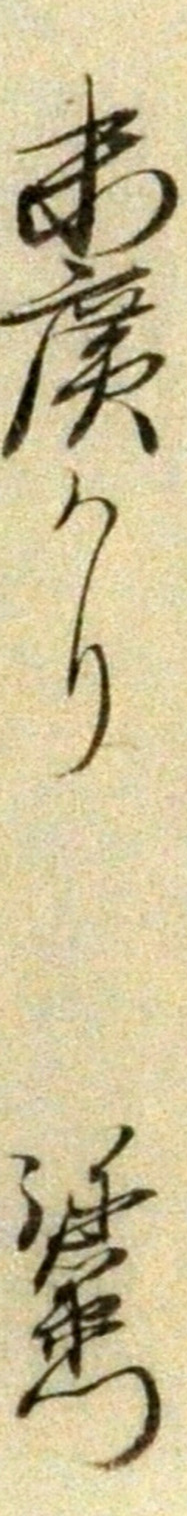末広かり弥右衛門
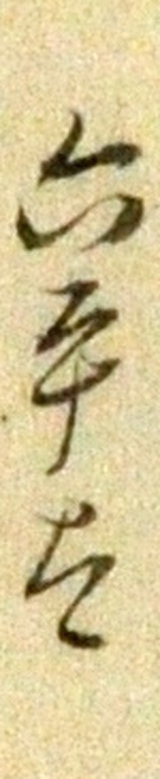六平太
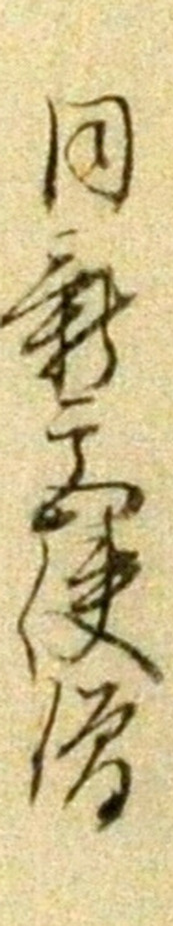同新宮使僧

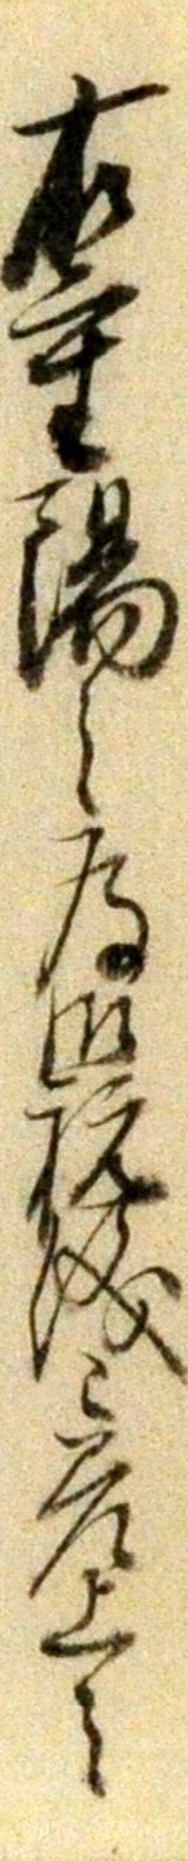右重陽之為御祝儀被差上之
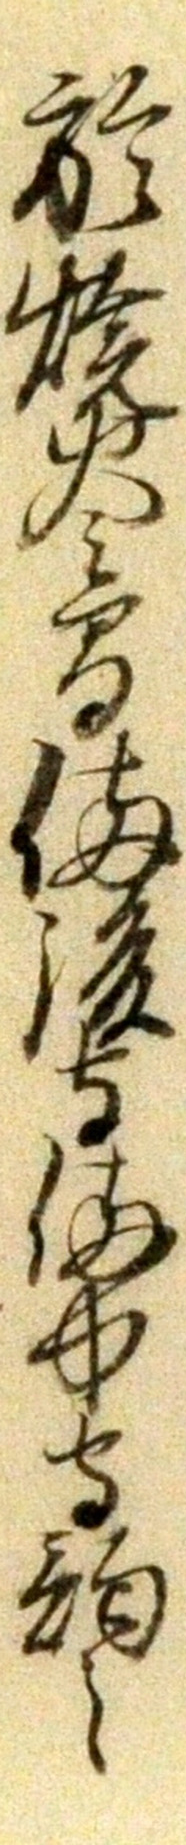於焼火之間備後守備中守謁之
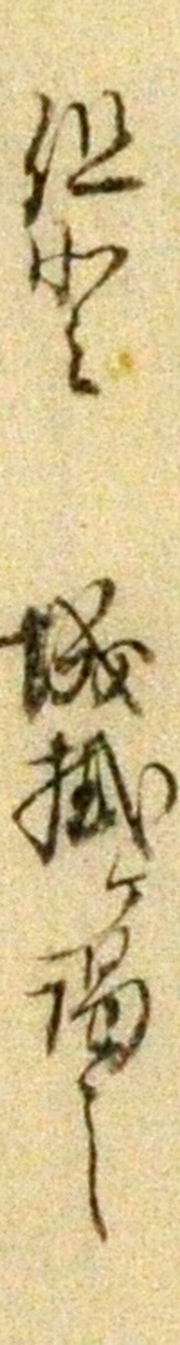但登城掛ケ謁之
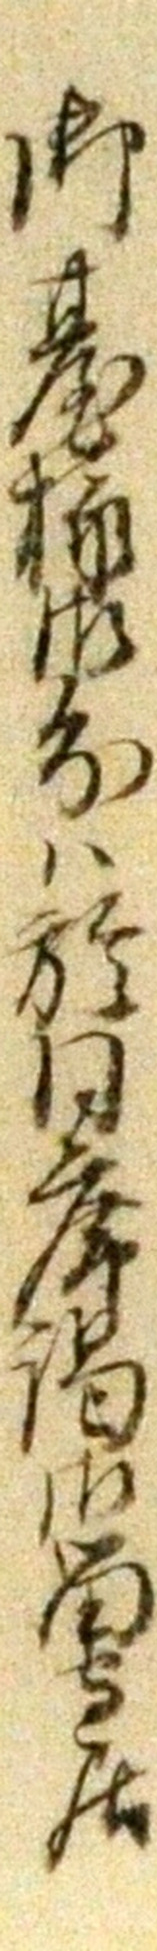御台様御分ハ於同席謁御留守居
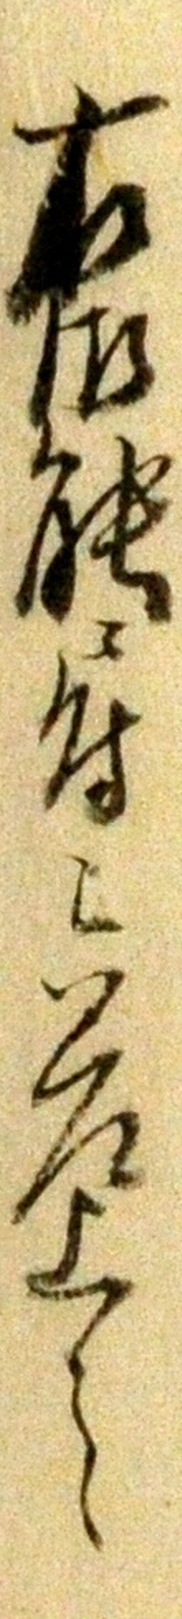右御能ニ付被差上之
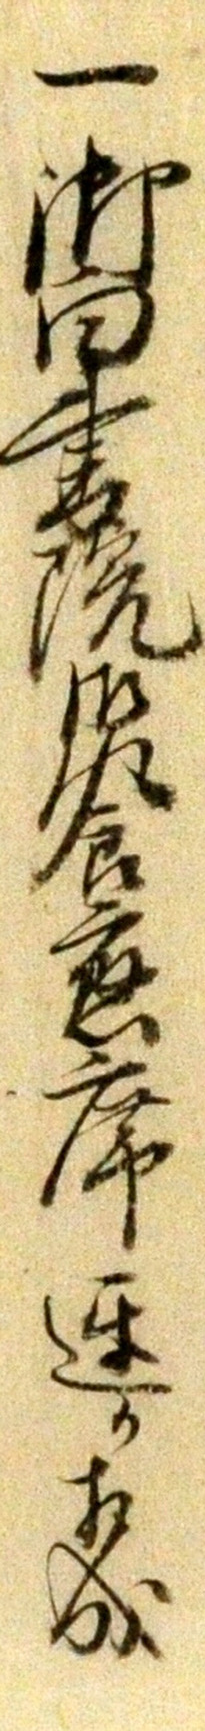一御白書院御饗応席遅ク相成
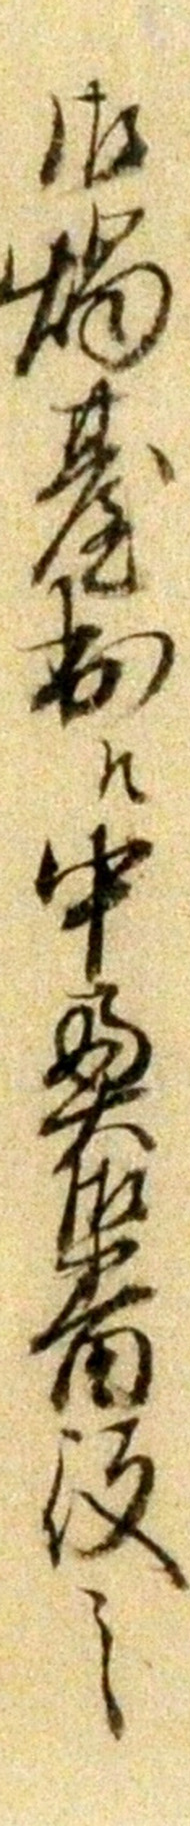御燭台出候中奥御番役之
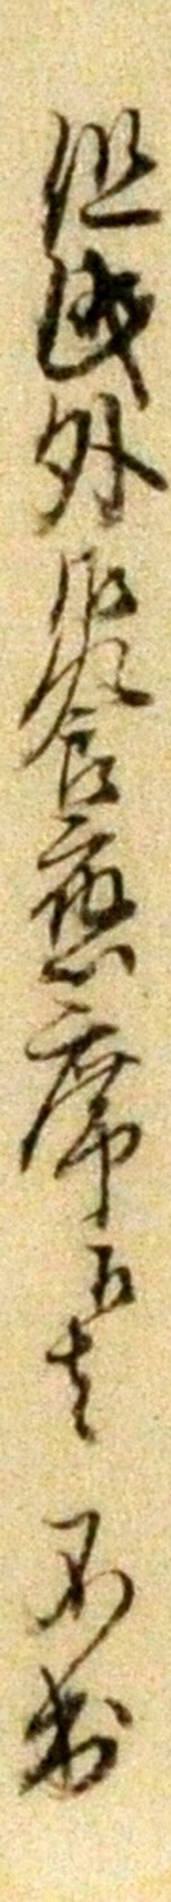但此外御饗応席えは不出
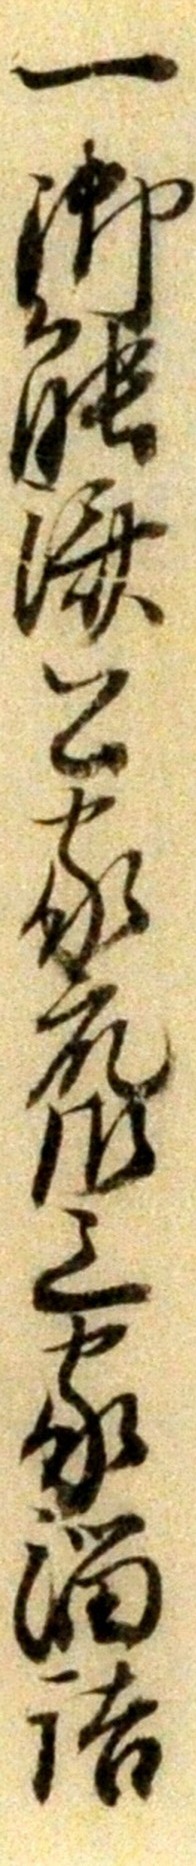一御能済公家衆御三家溜詰
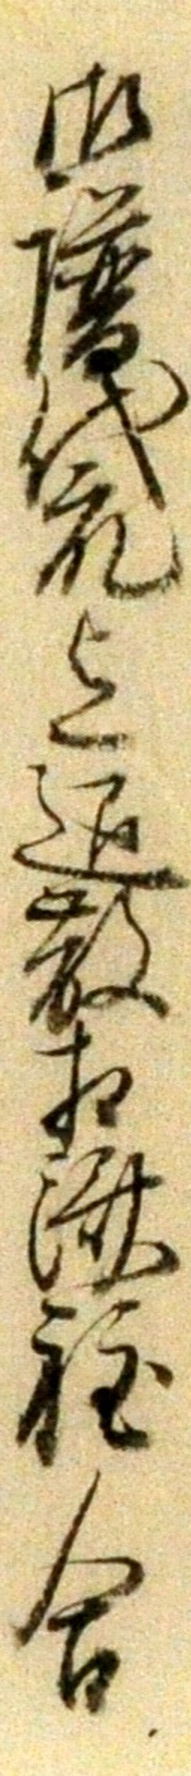御譜代衆迄退散相済程合
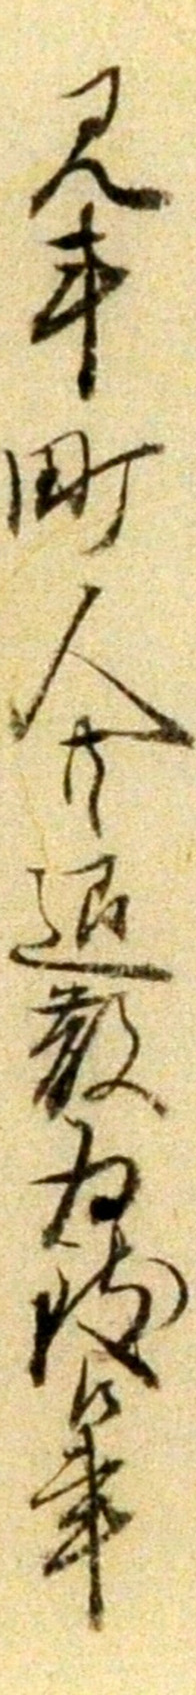見計町人共退散為致候事
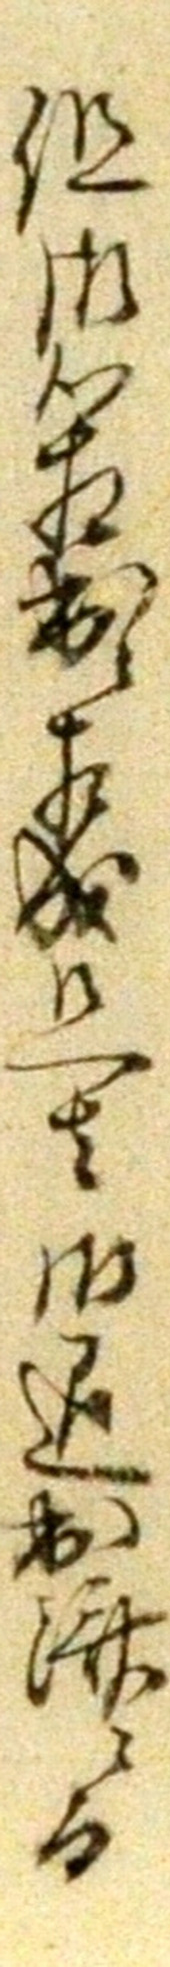但御箱出ニ相成候へは御退出済ニ而
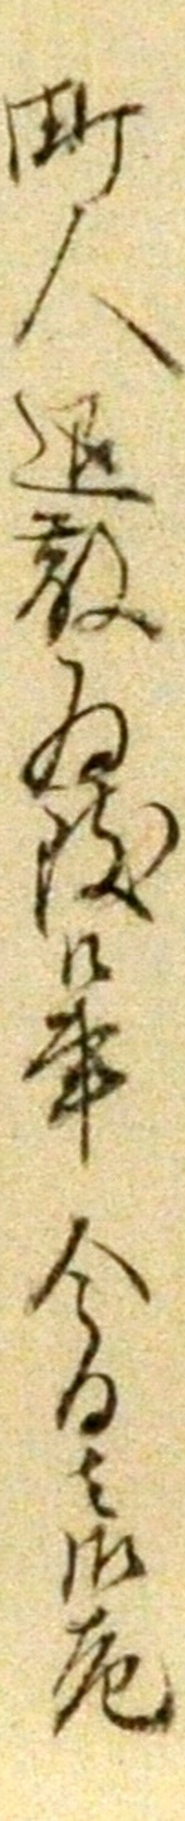町人退散為致候事今日は御老
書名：御馳走御能ノ節ノ留外
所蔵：伊那市立高遠町図書館・合同会社AMANE
